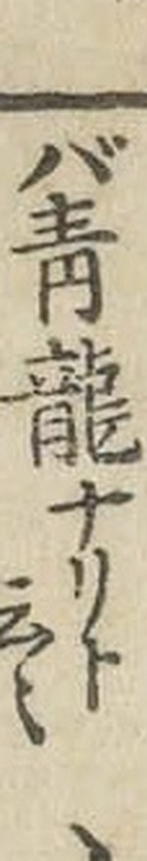バ青龍ナリト云々
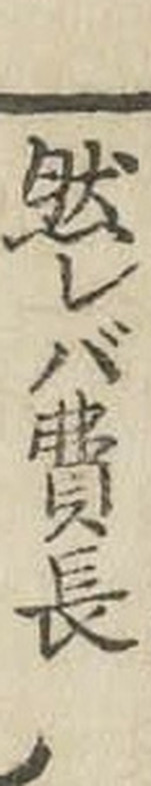然レバ費長
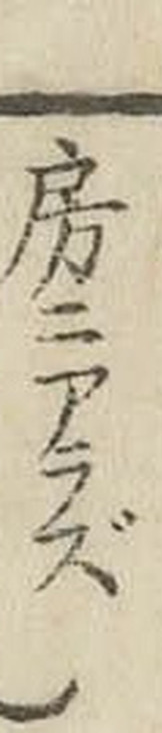房ニアラズ
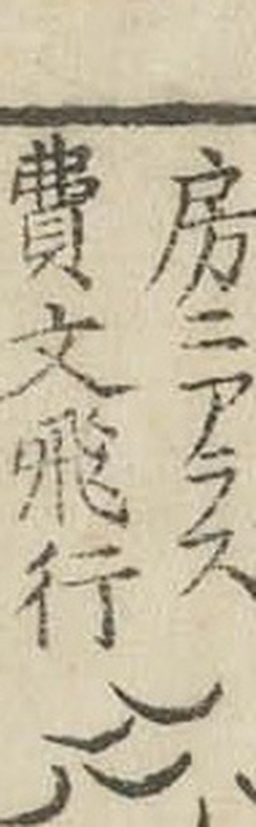費文飛行
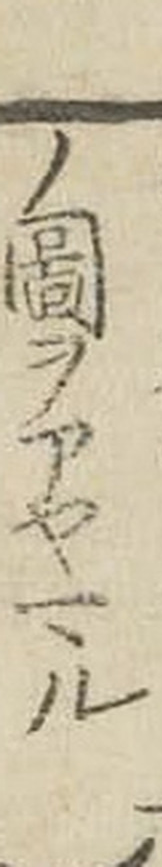ノ図ヲアヤマル
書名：絵本写宝袋 9巻 7之巻
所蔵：東京学芸大学教育コンテンツアーカイブ
